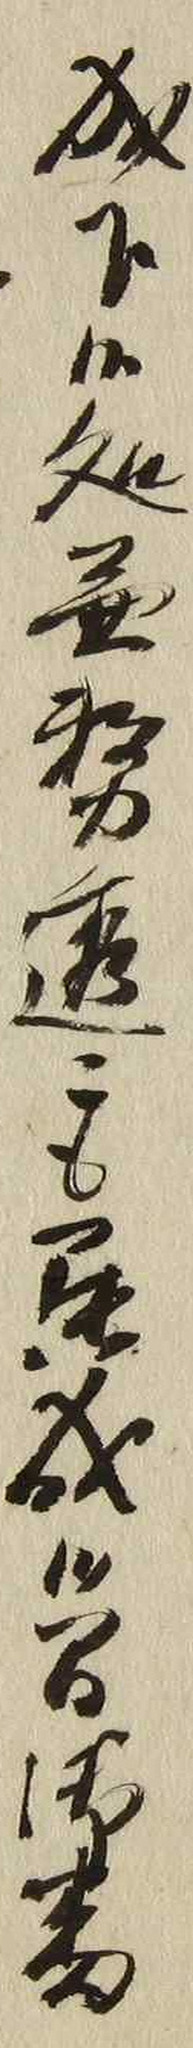成下候処兼務透にも罷成候間御番
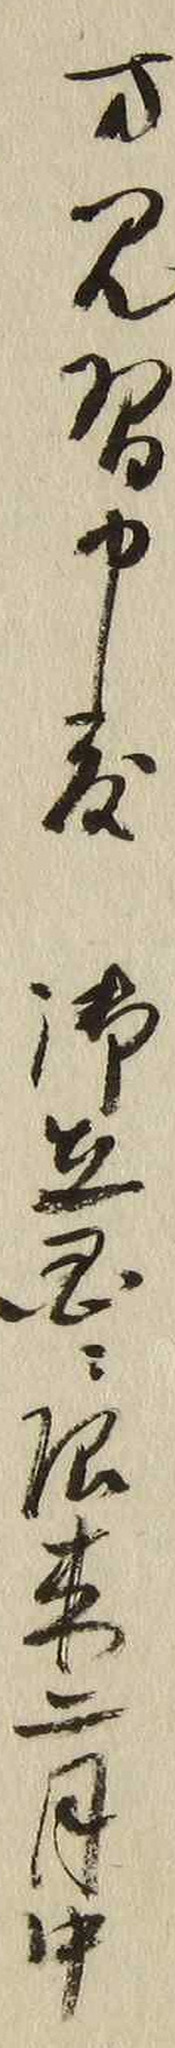方見習申度御在国に限來二月中
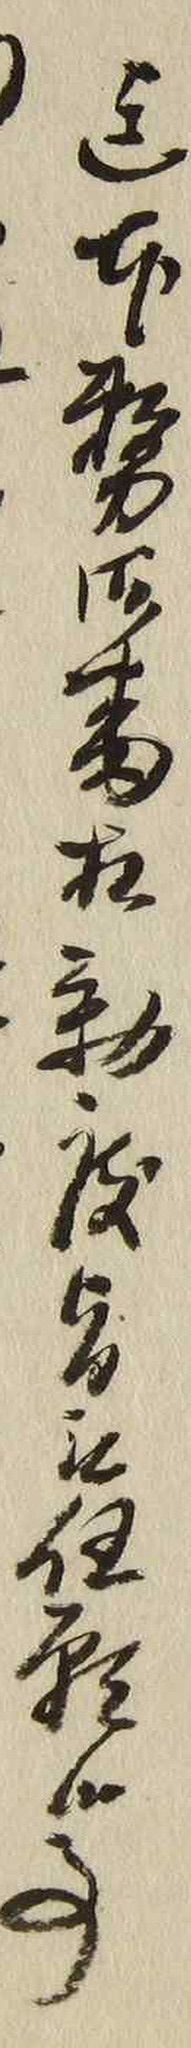迄本務御番相勤度旨被任願候事
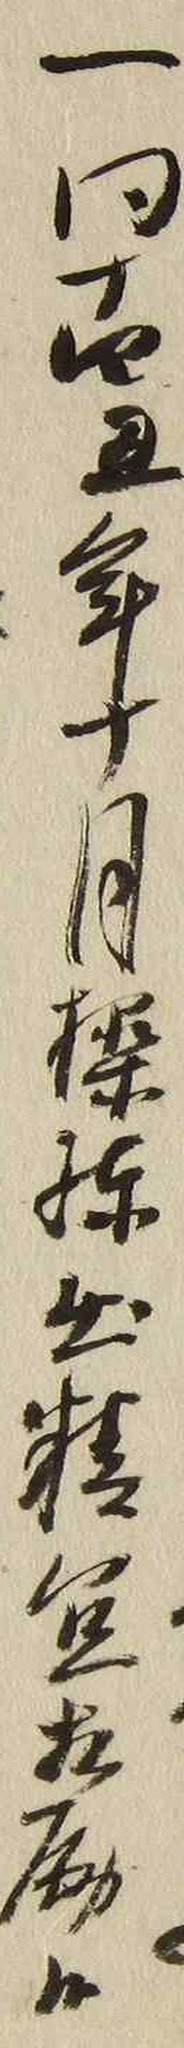一同十四丑年十月繰練出精宜相励候
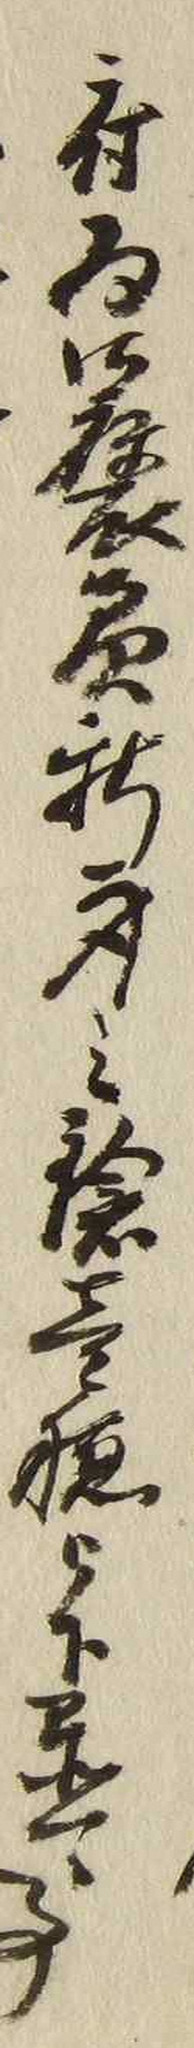に付為御褒美新身之鎗壱穂被下置候事
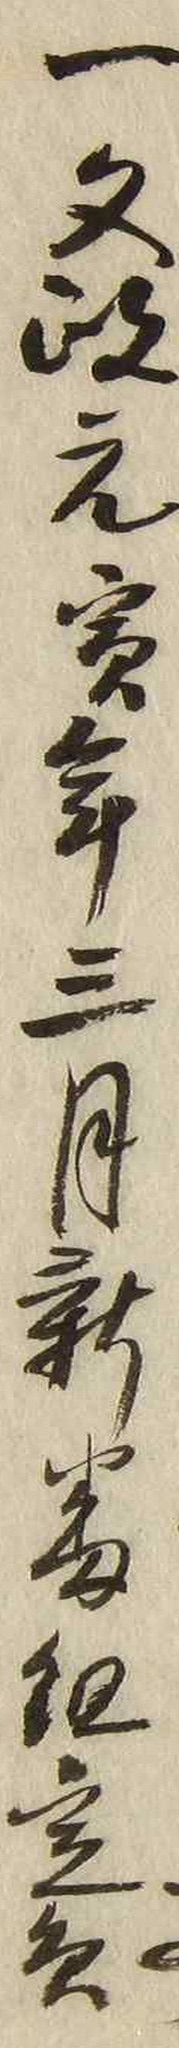一文政元寅年三月新番組定員

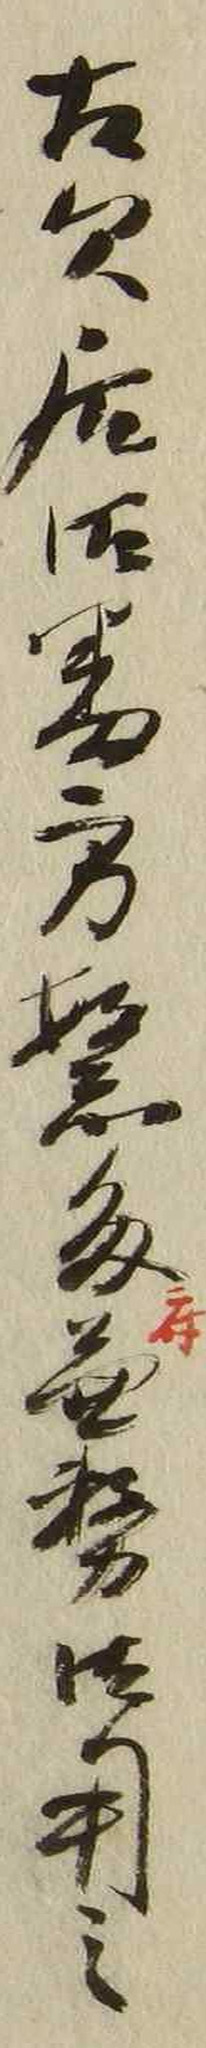相欠居御番方繁多に付兼務御用之
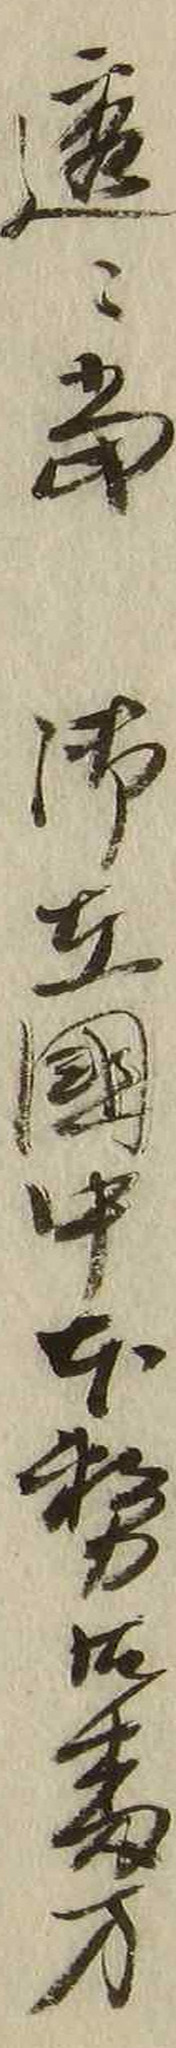透に当御在国中本務御番方
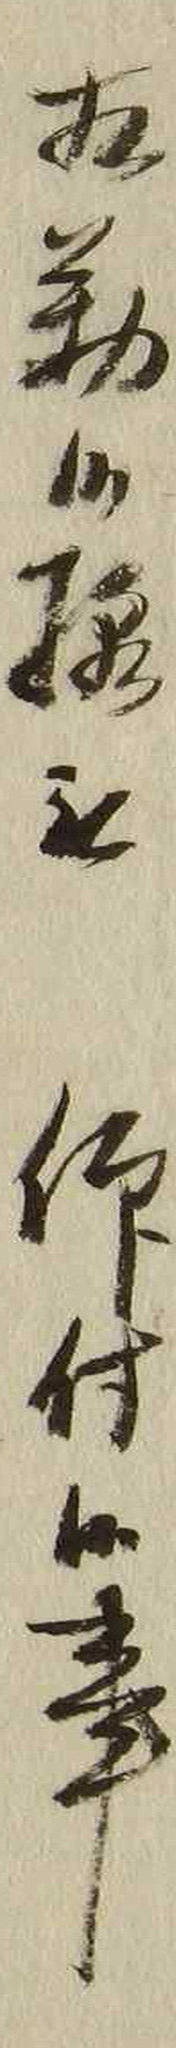相勤候様被仰付候事
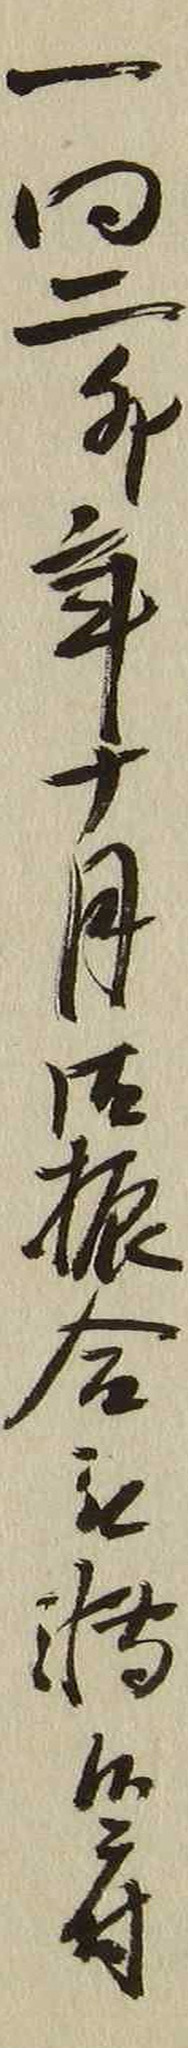一同二卯年十月御振合被転候に付
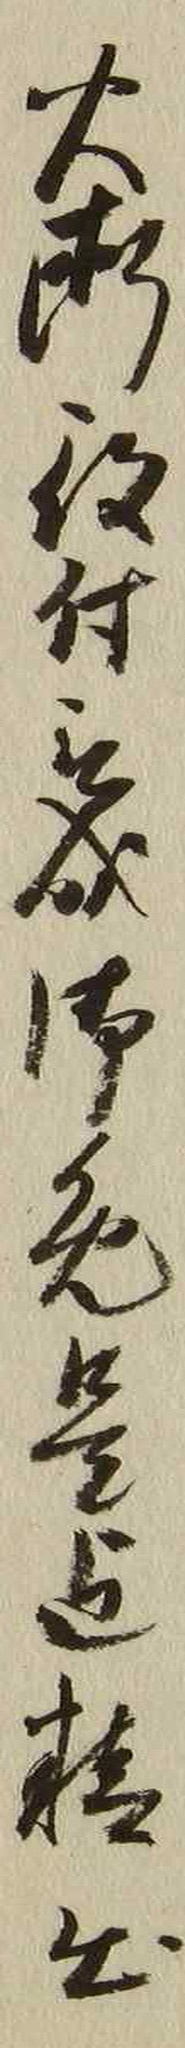火術役付被成御免是迄精出
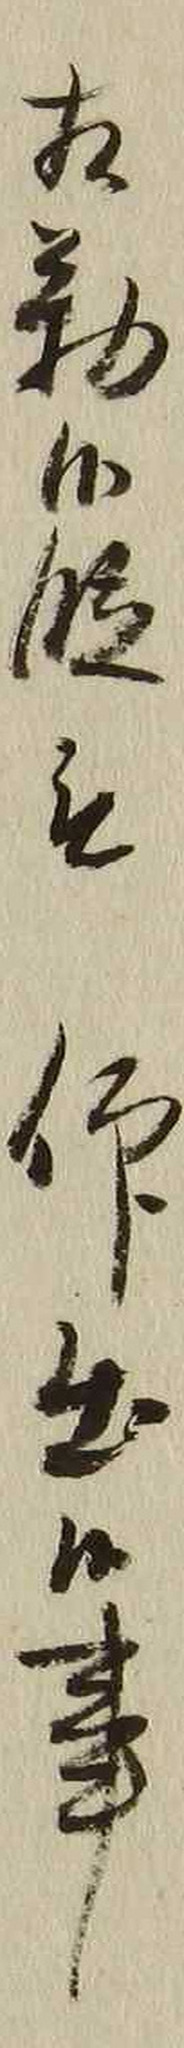相勤候段被仰出候事
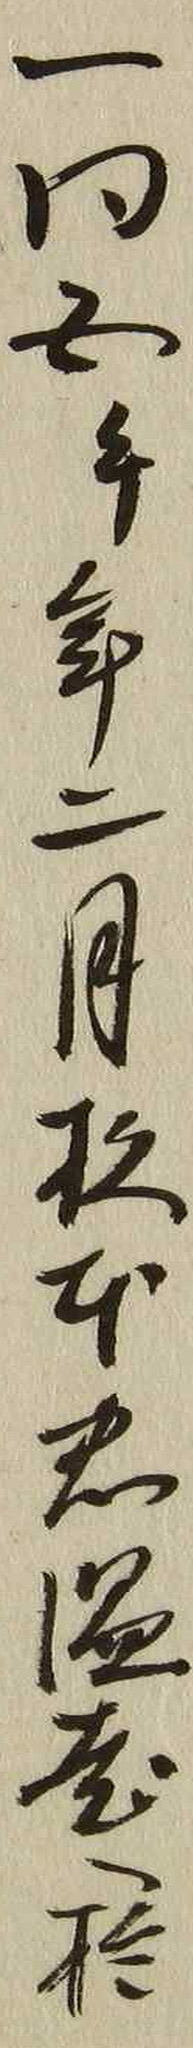一同五午年二月杉本忠温老へ於
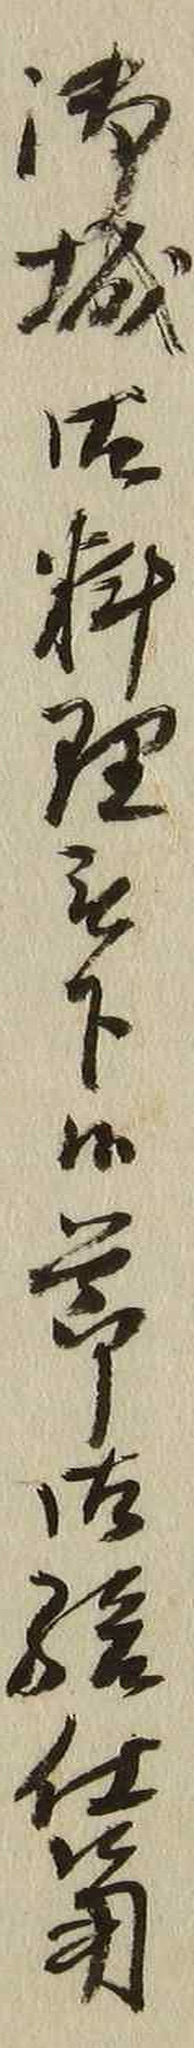御城御料理被下候節御給仕御用
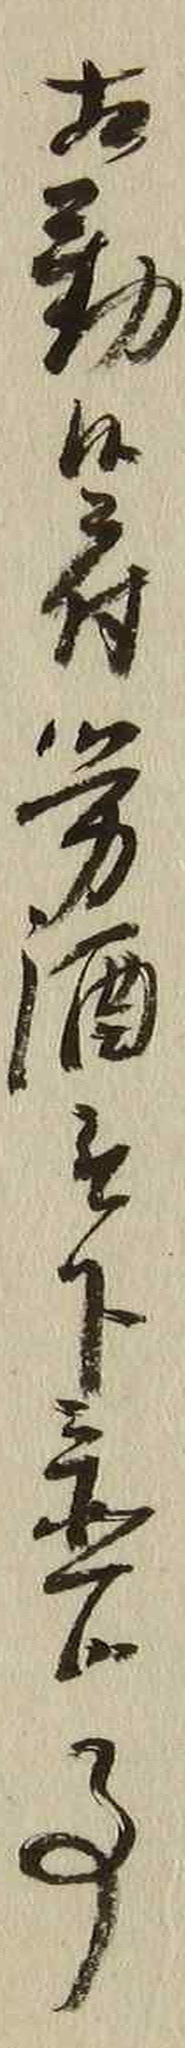相勤候に付労酒被下置候事
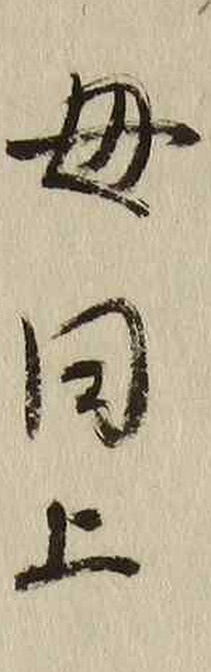母同上
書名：諸士系譜　巻之360　す之部10
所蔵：会津若松市立会津図書館
